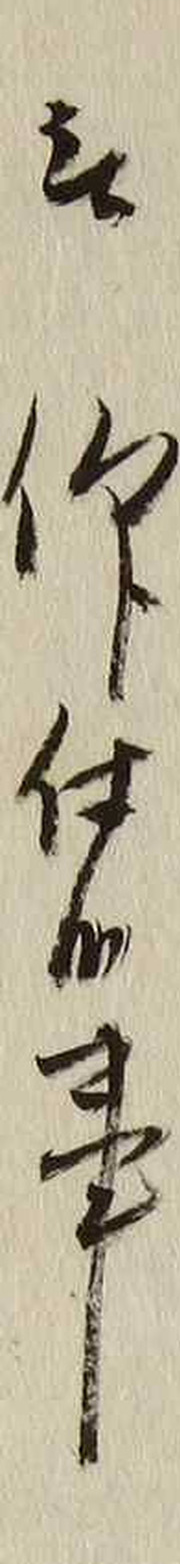被仰付候事
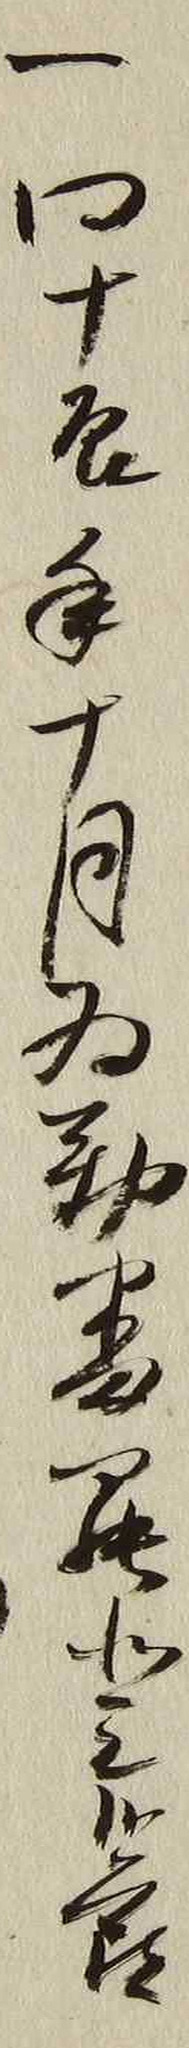一同十辰年十月為勤番罷登候節
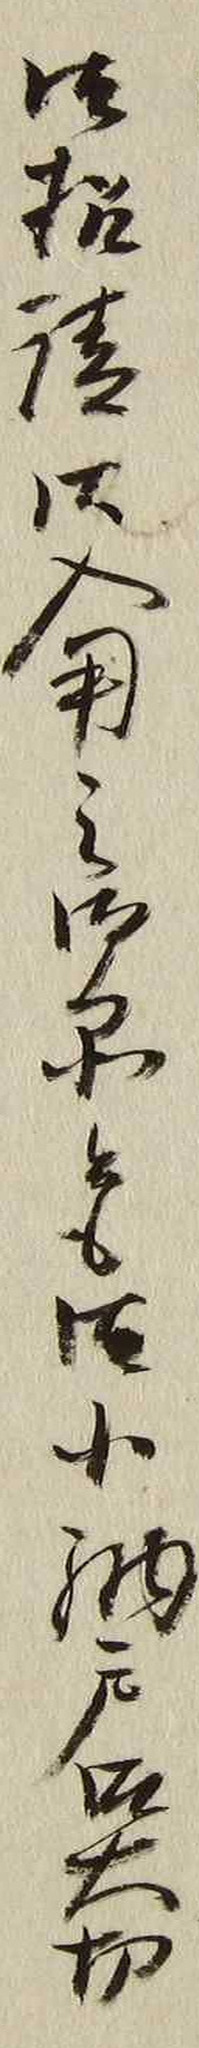御招請御入用之御品とも御小納戸御大切
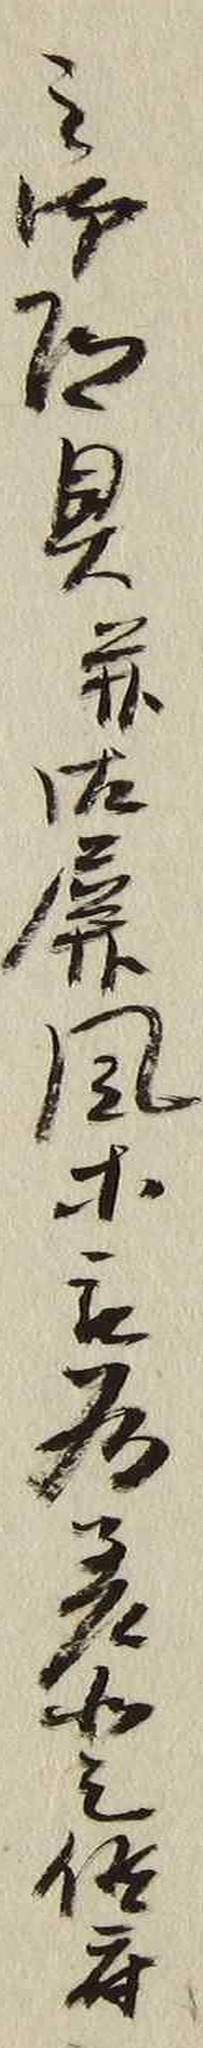之御道貝并御屏風等被為差登候ニ付
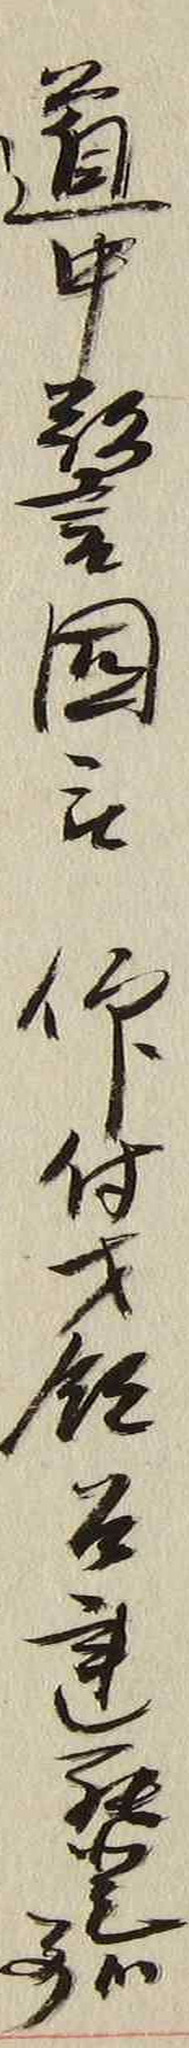道中警固被仰付才領召連罷登候事
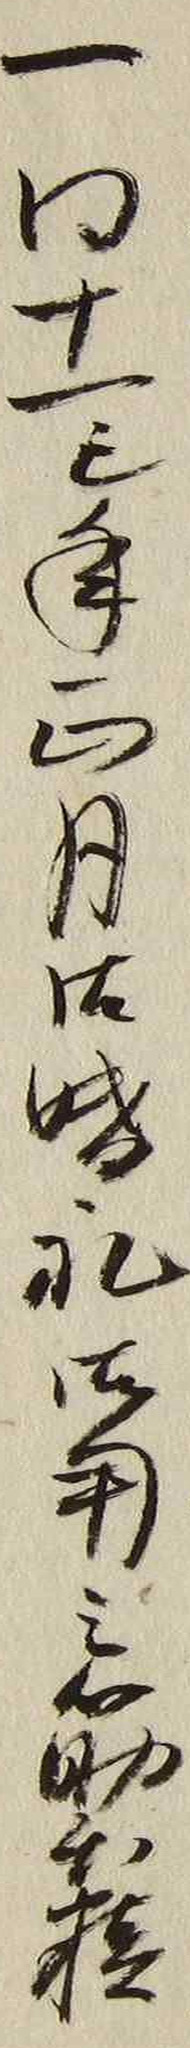一同十一巳年正月御婚礼御用之節出精
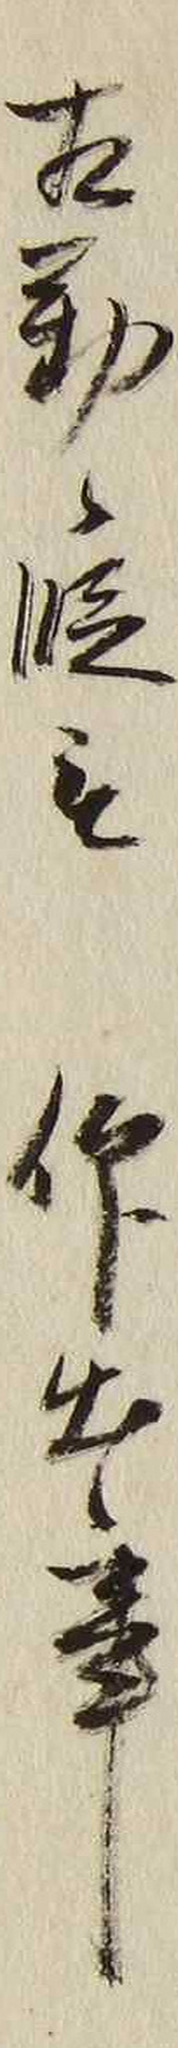相勤候段被仰出候事
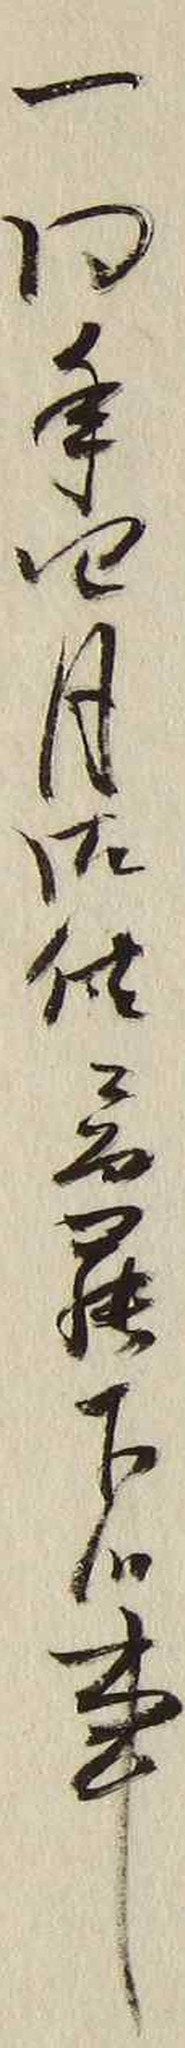一同年四月御供ニ而罷下候事

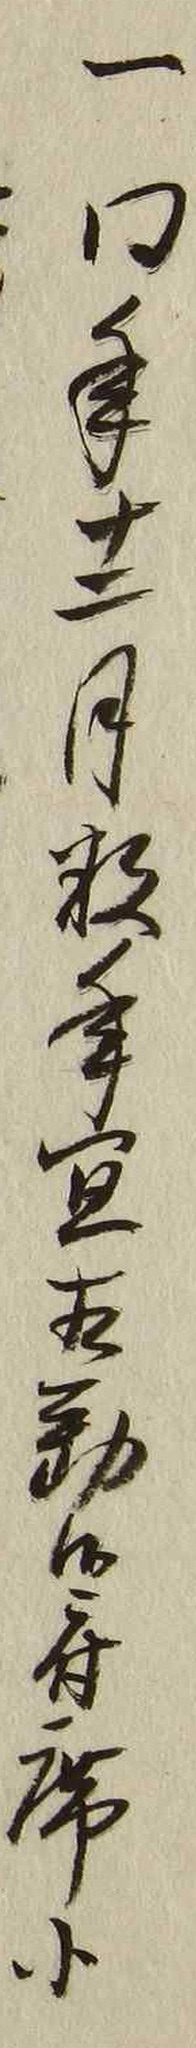一同年十二月数年宜相勤候ニ付席小
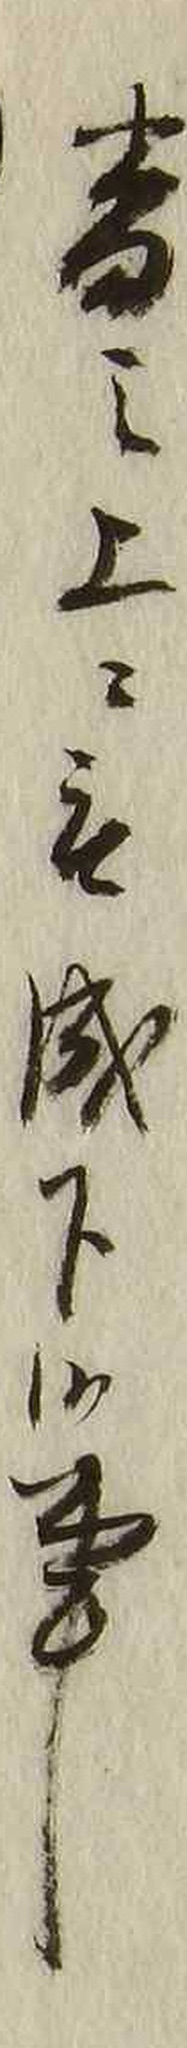番之上ニ被成下候事
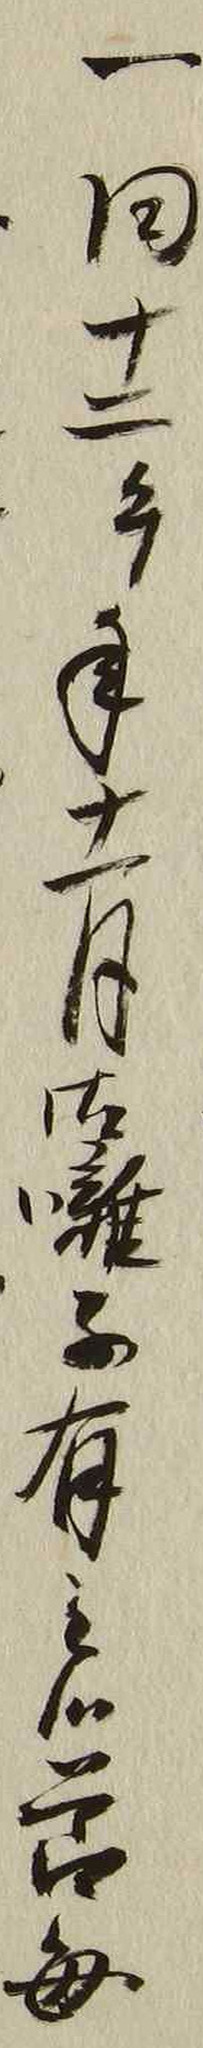一同十二午年十一月御囃子有之候節毎
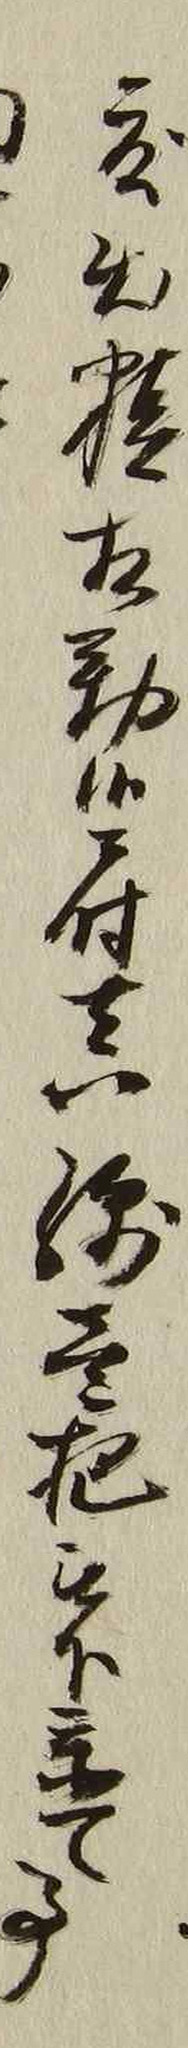度出精相勤候ニ付真綿壱把被下置候事
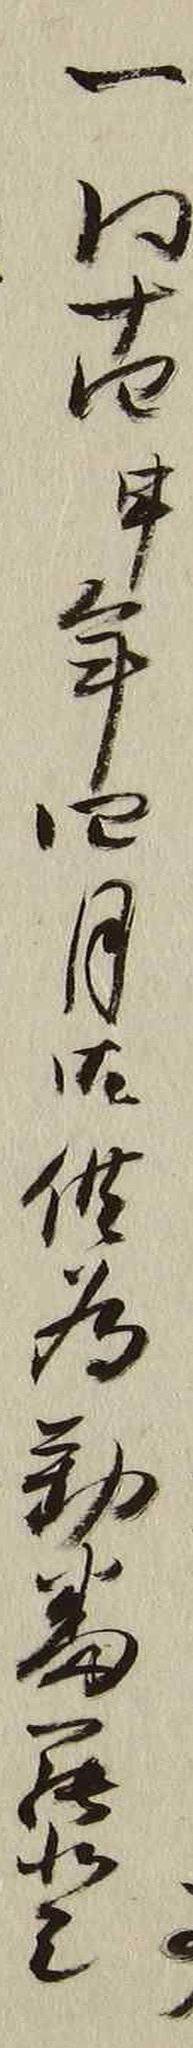一同十四申年四月御供為勤番罷登
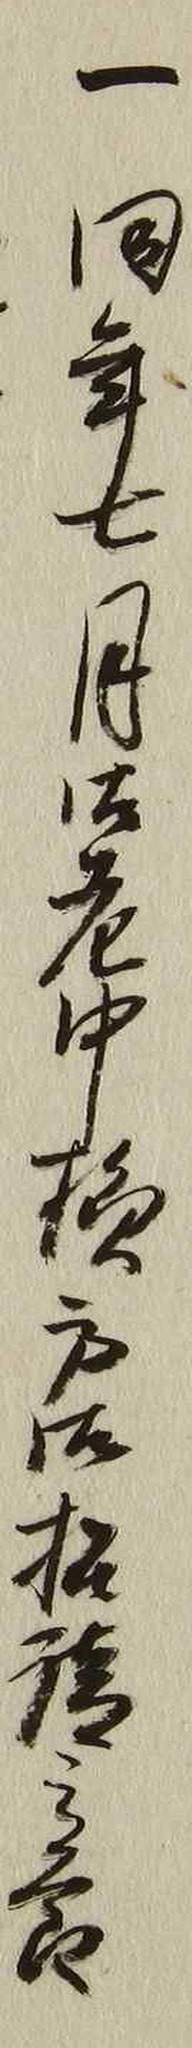一同年七月御老中様方御招請之節
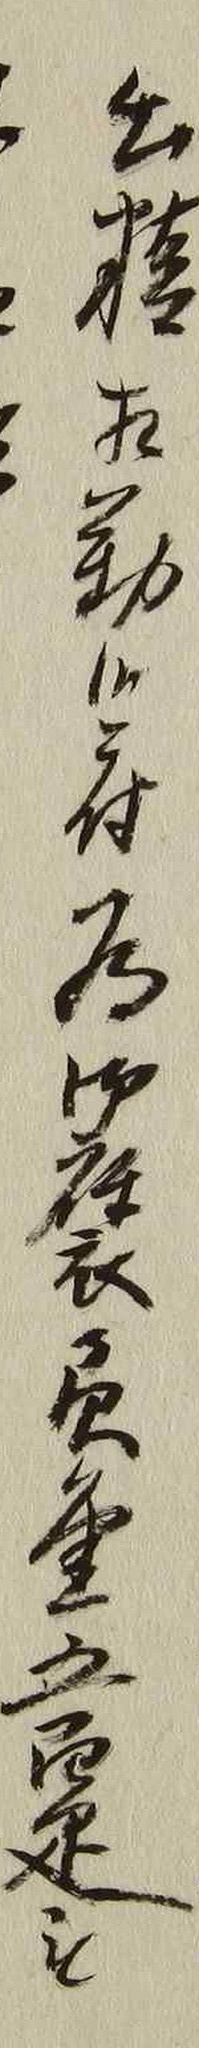出精相勤候ニ付為御褒美金五百疋被
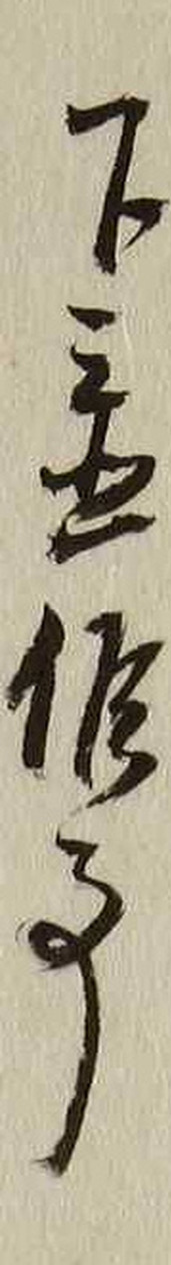下置候事
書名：諸士系譜　巻之349　も之部5
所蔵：会津若松市立会津図書館
